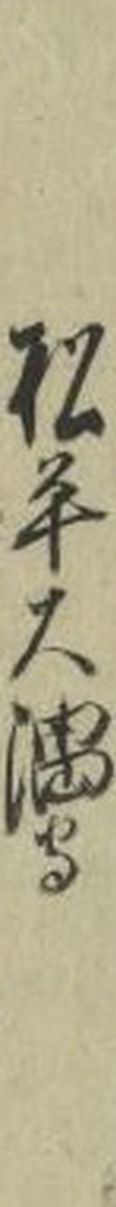松平大隅守
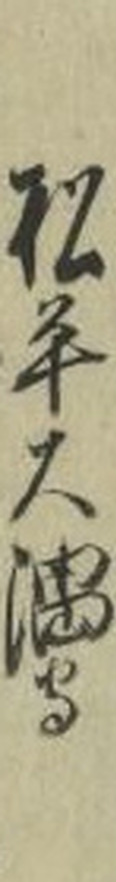松平大隅守
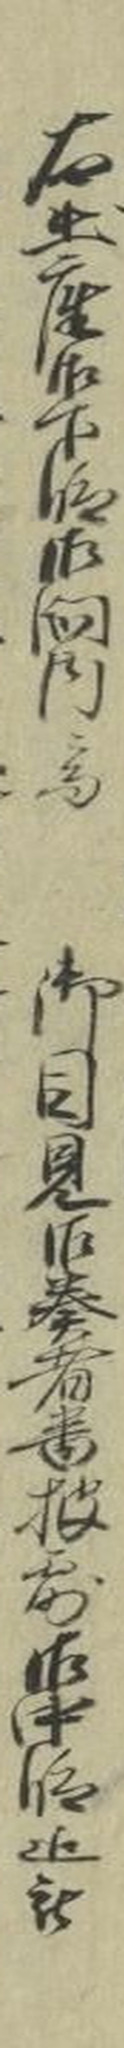右出座御下段御閾内にて御目見御奏者番披露御中段迄被
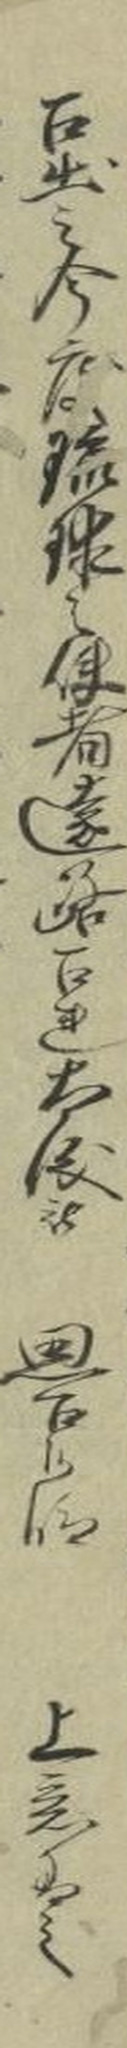召出之今度琉球之使者遠路召連大儀被思召候段上意有之
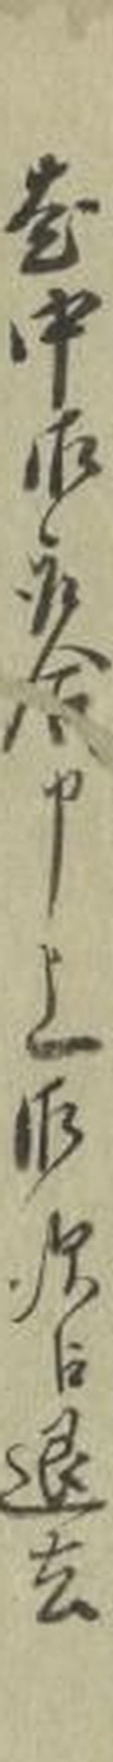老中御取合申上御次え退去
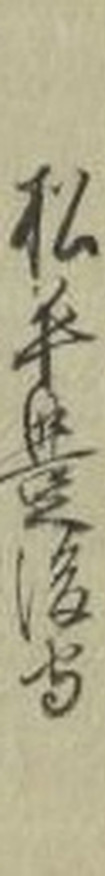松平豊後守
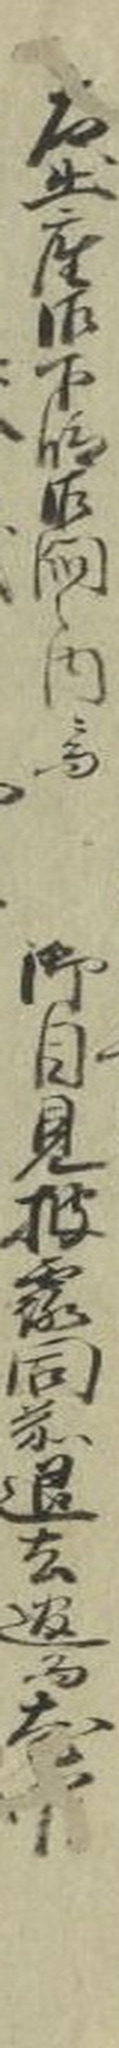右出座御下段御閾之内にて御目見披露同前退去過て老中
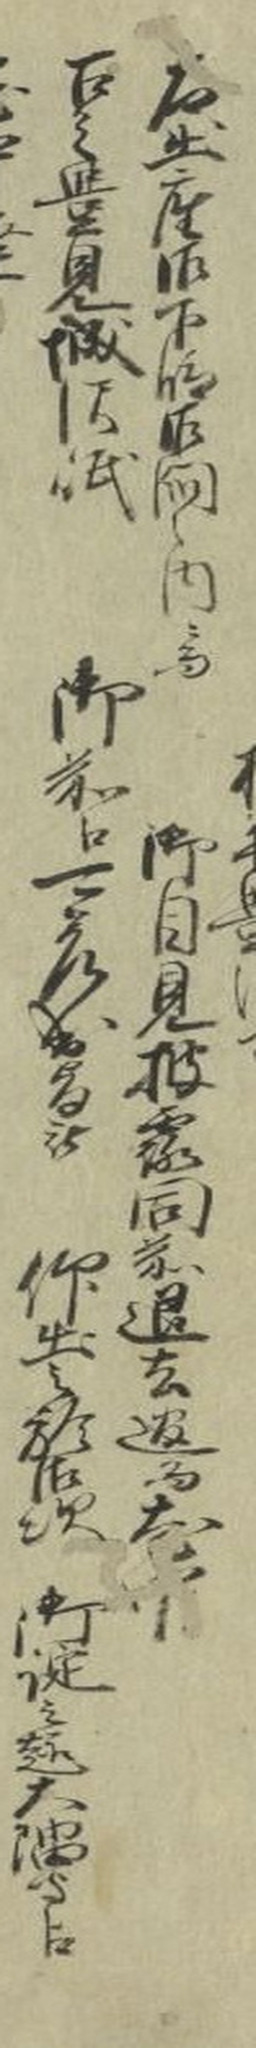召之豊見城沢岻御前え可差出旨被仰出之於御次御諚之趣大隅守え
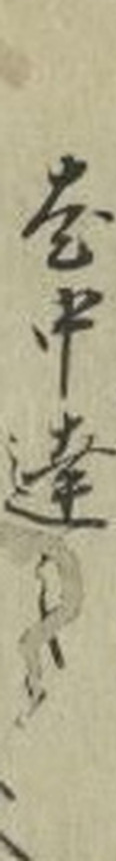老中達之
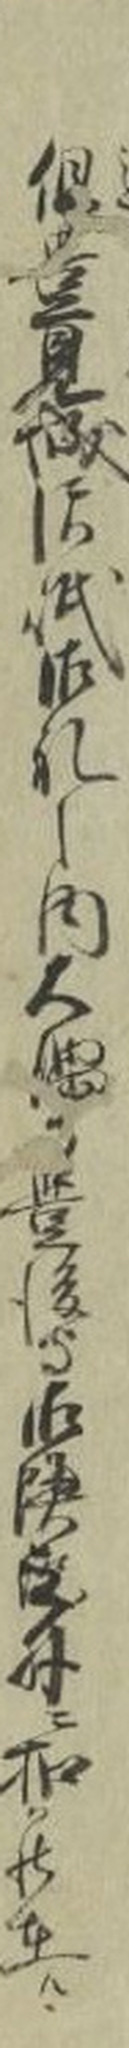但豊見城沢岻御礼之内大隅守豊後守御襖御外に扣罷在候
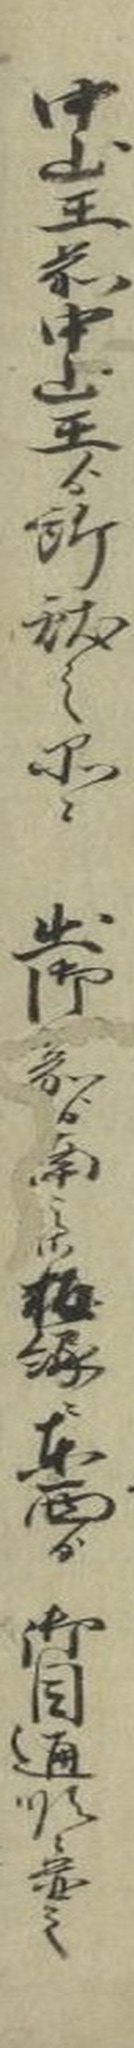一中山王前中山王ゟ所献之品々出御前ゟ南之御板縁に東西ゟ御目通順に並之

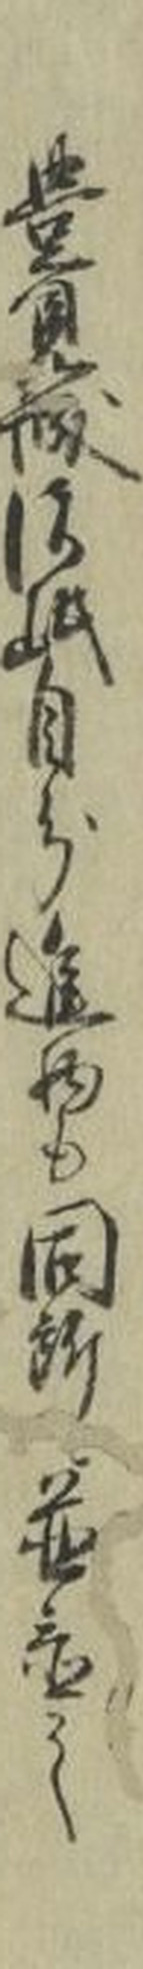豊見城沢岻自分進物も同断に並置之
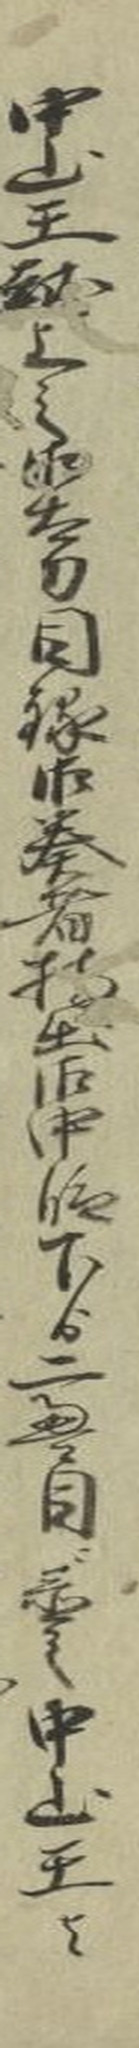一中山王献上之御太刀目録御奏者持出御中段下ゟ二畳目に置之中山王は
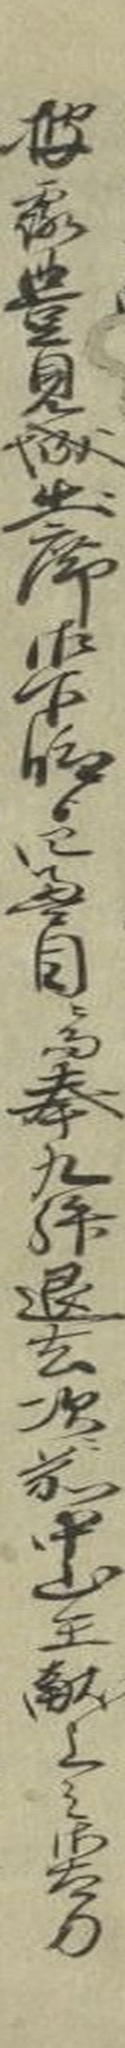披露豊見城出席御下段ゟ四畳目にて奉九拝退去次前中山王献上之御太刀
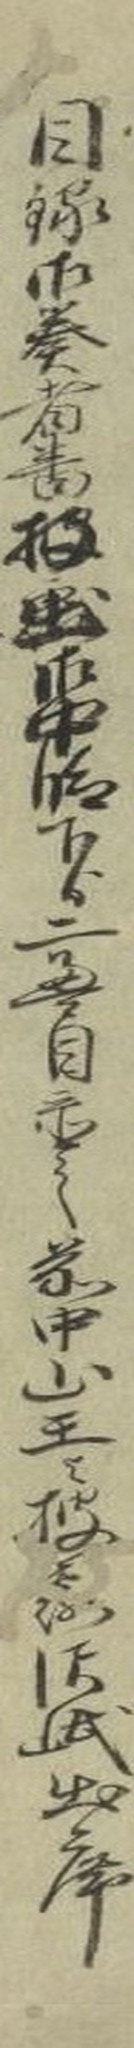目録御奏者番披出御中段下ゟ二畳目置之前中山王と披露沢岻出席
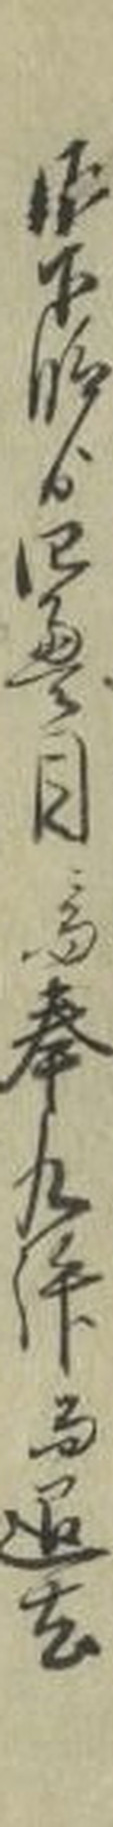御下段ゟ四畳目にて奉九拝而退去
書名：天保三壬辰年琉球人参府之節勤方書留
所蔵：University of the Ryukyus Library
